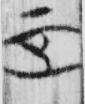正
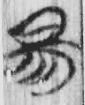昜（陽）
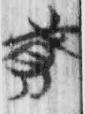貸
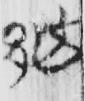○（越）
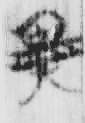異
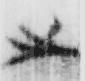之
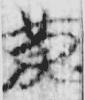黃
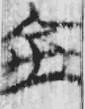金
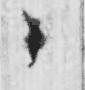十
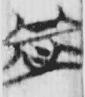益
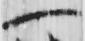一
